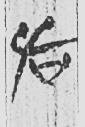左
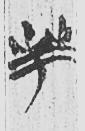芋
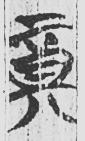奠
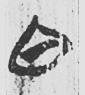白
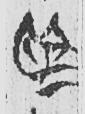爲
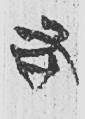右
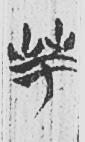芋
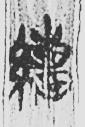{糸東田}
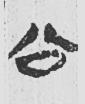公
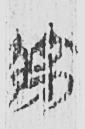叔
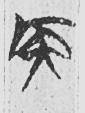侯
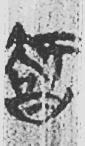智
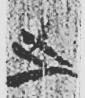之
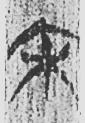宋
